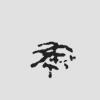不
